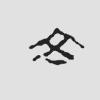{文一}
